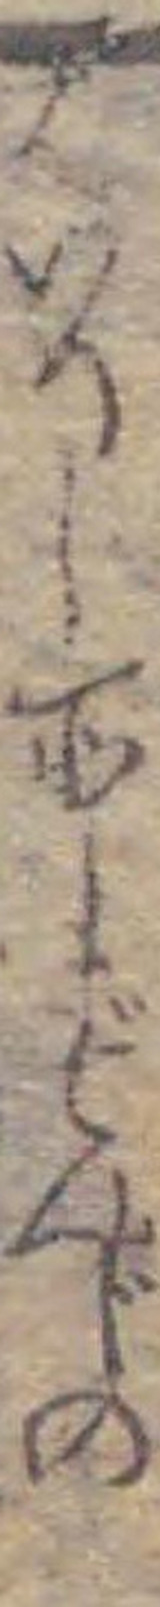まくいりし所にぞんじの
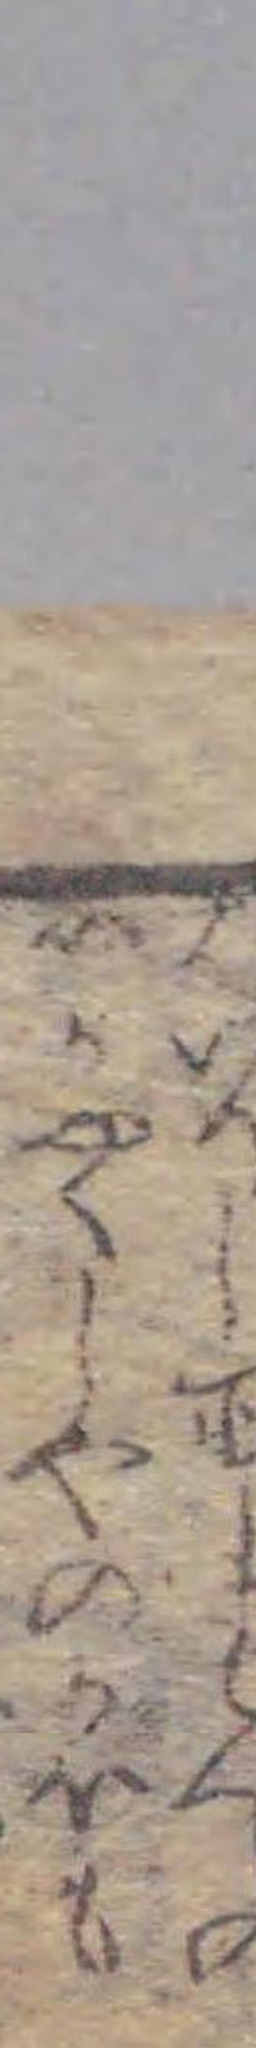やくしやのかほも
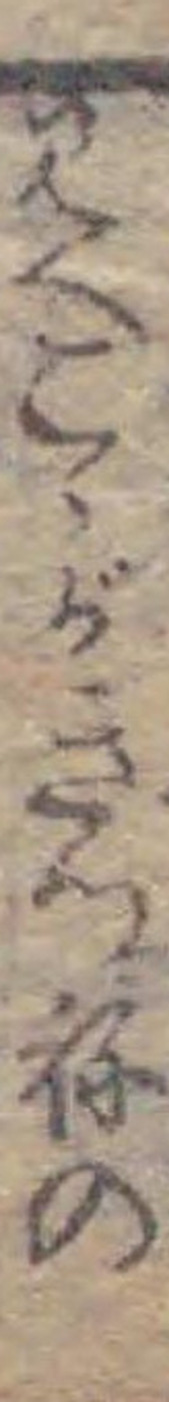見へこゝがきつねの
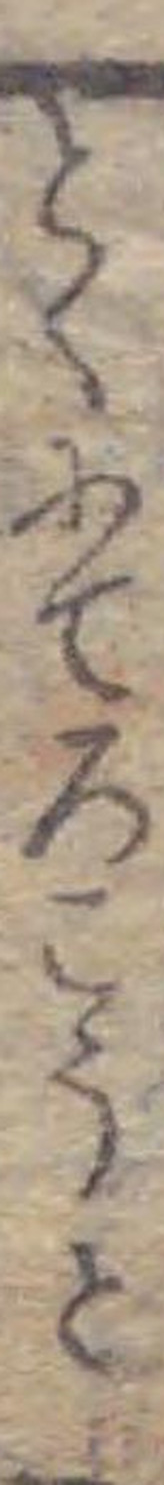とくにてろこうと
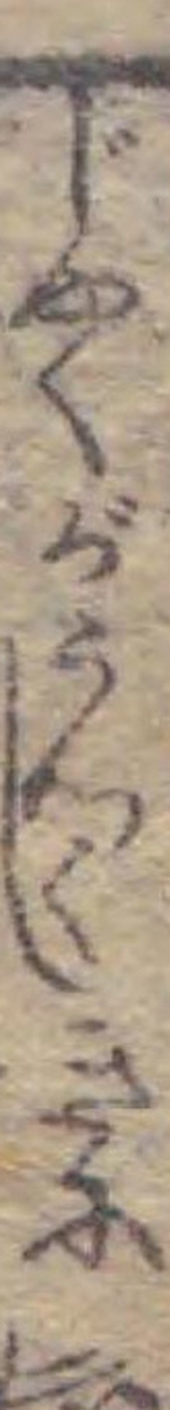じやくがうつくしくきに
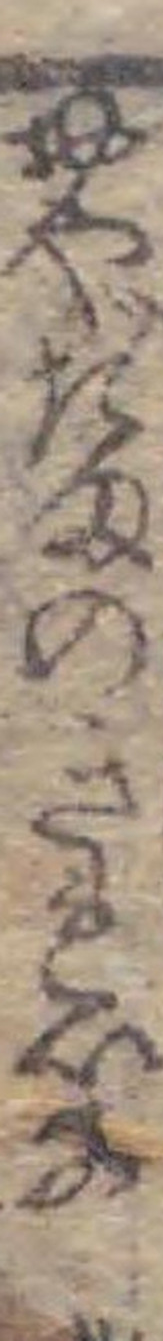おやだまのきれいな
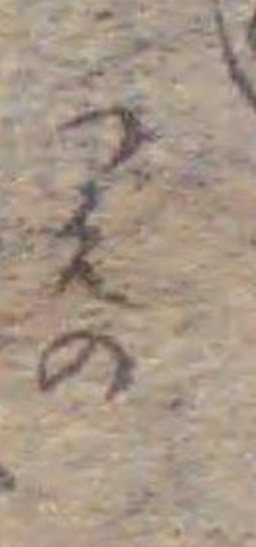つえの
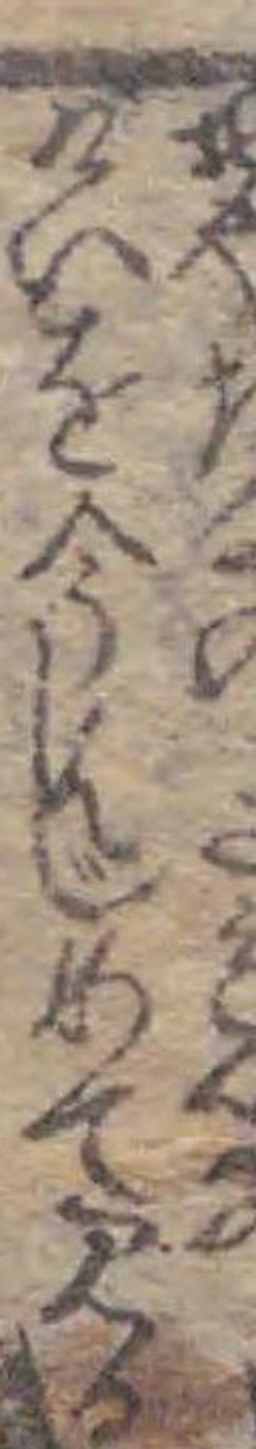げいを今はじめて見る
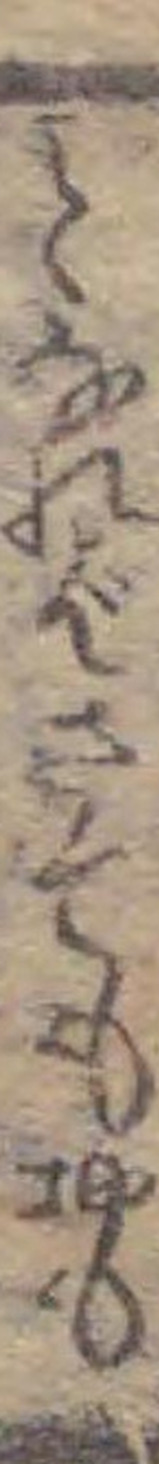となればさてもおも
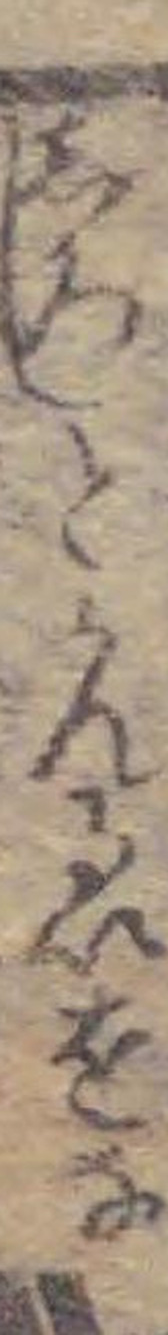しろしとかんるいをな
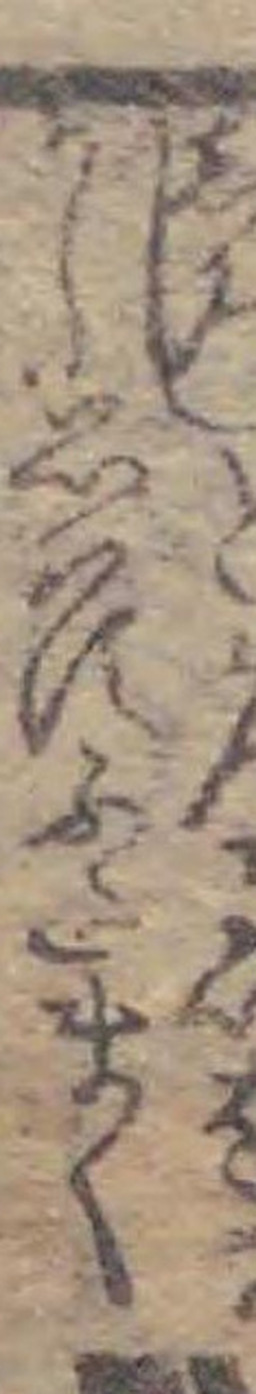かし思はすふたまく
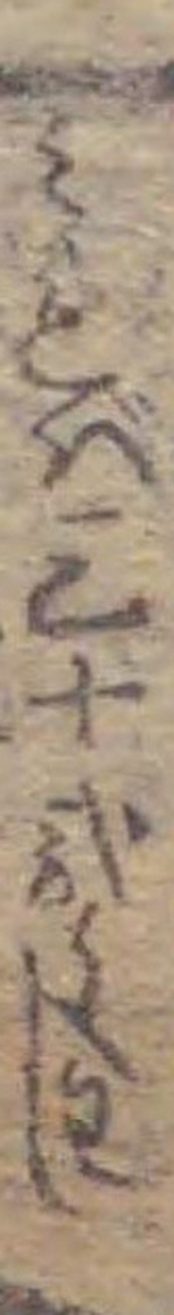みれば三十弐文わし
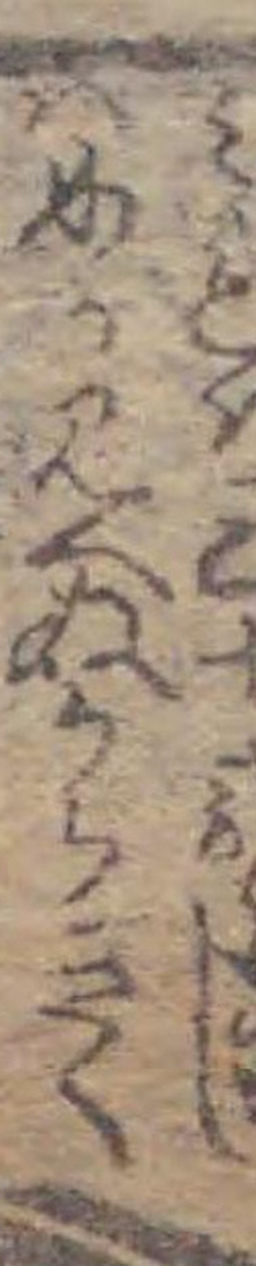はめが見へぬからきく
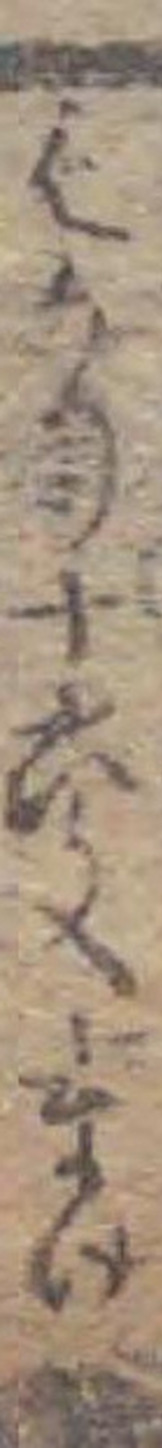ばかり十六文まけ
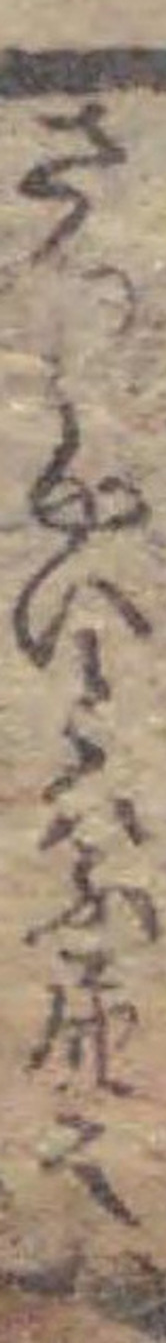さつしやいとはふ届也
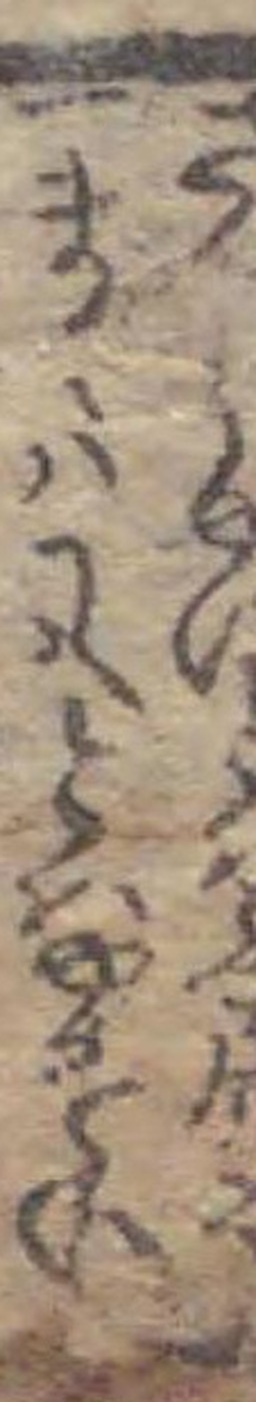一まくは又とはやすい
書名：紺屋百物語 : 3巻
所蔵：国立国会図書館 National Diet Library, JAPAN
